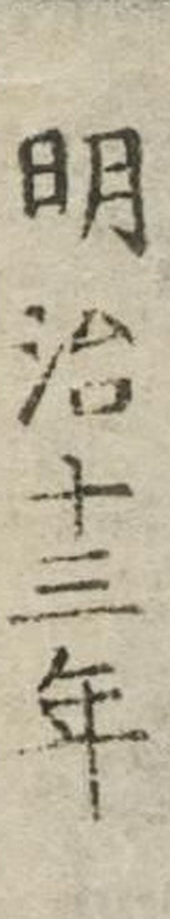明治十三年
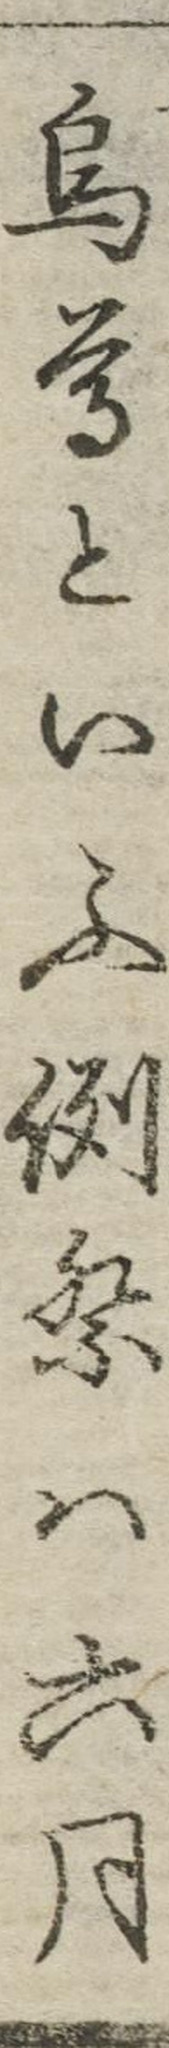烏尊といふ例祭は六月
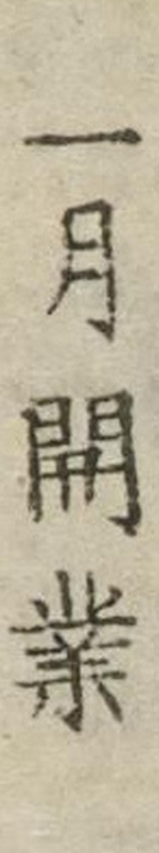一月開業
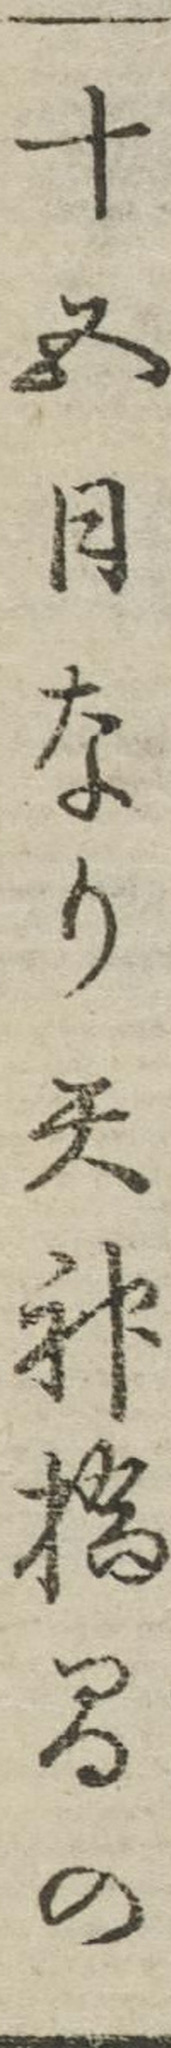十五日なり天神橋間の
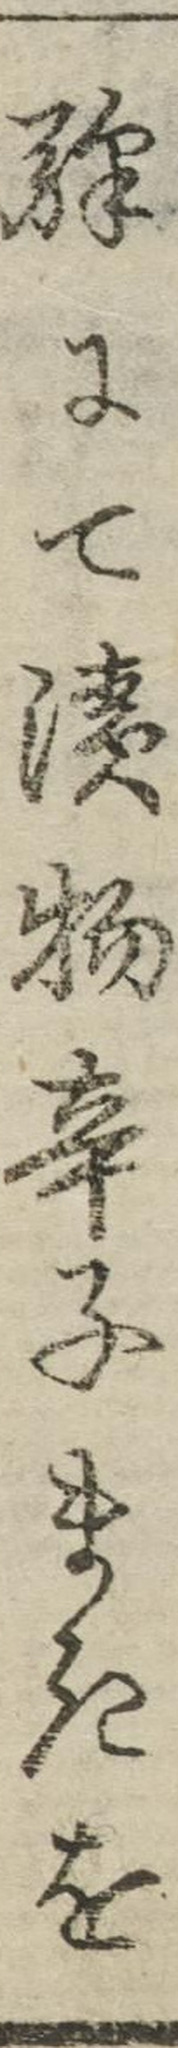驛にて漬物辛子まきを
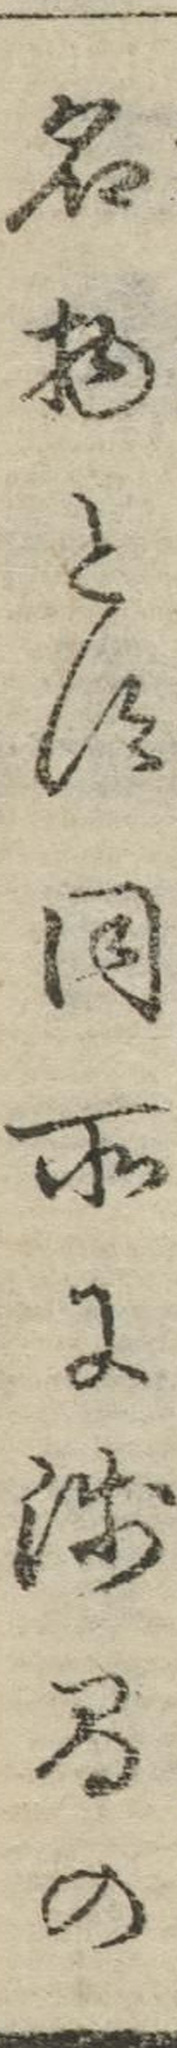名物とす同所に浅間の

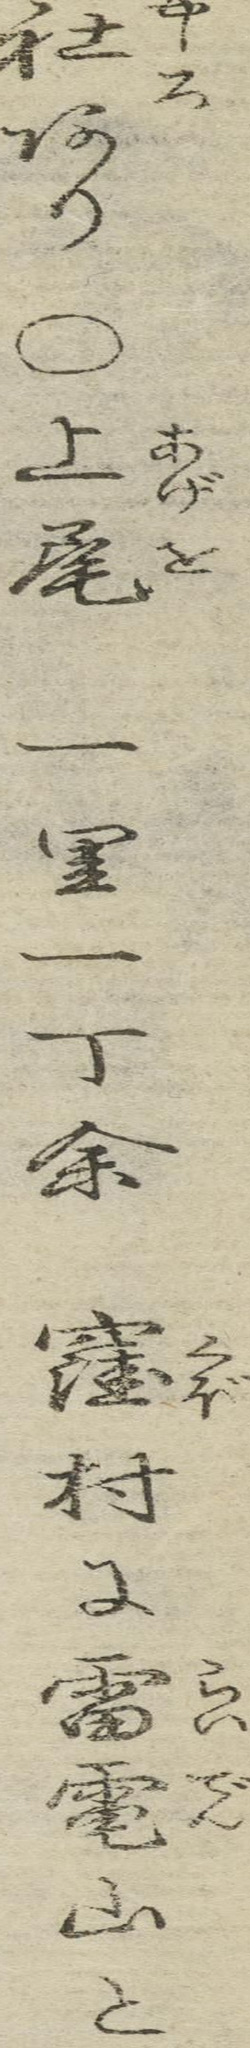社あり○上尾一里一丁余窪村に雷電山と
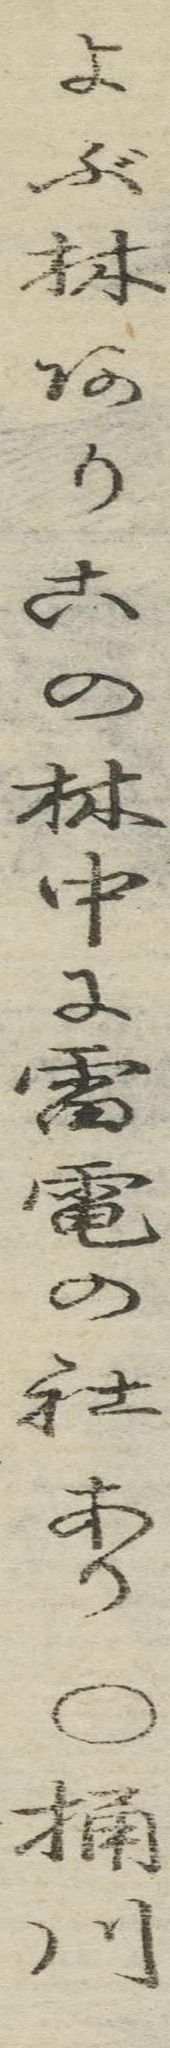よぶ林ありこの林中に雷電の社あり○桶川
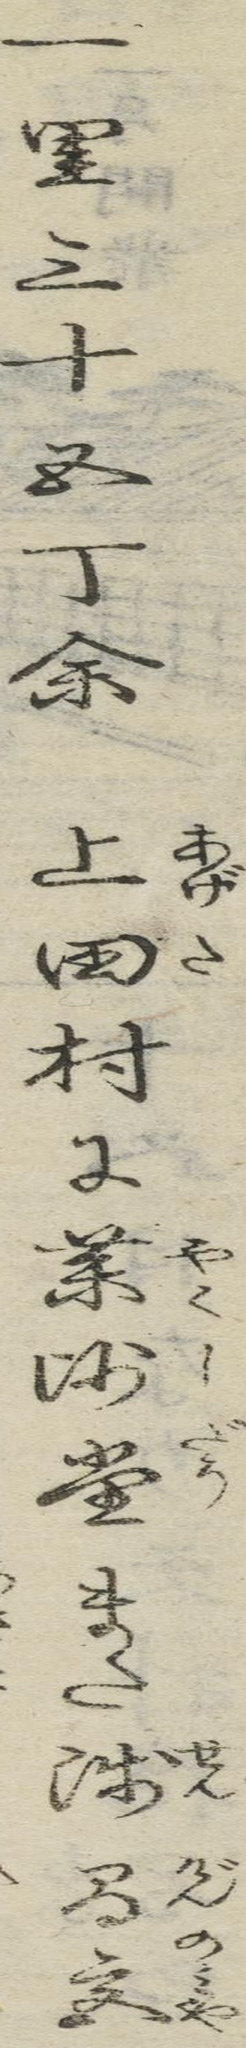一里三十五丁余上田村に薬師堂また浅間宮
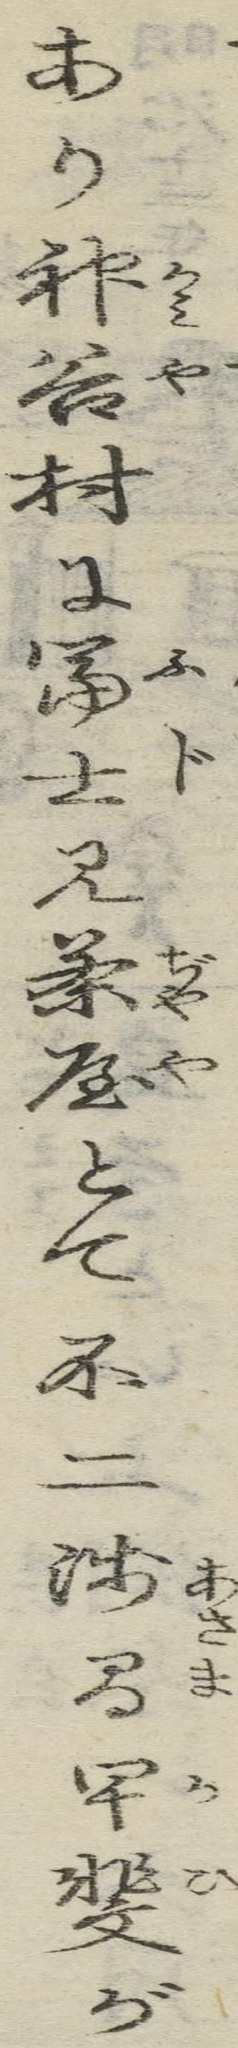あり神谷村に富士見茶屋とて不二浅間甲斐が
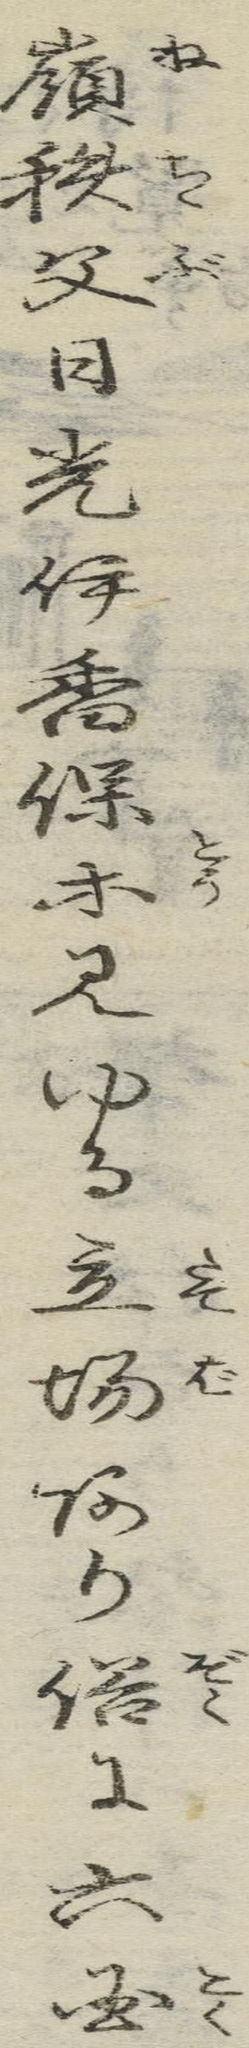嶺秩父日光伊香保等見ゆる立場あり俗に六国
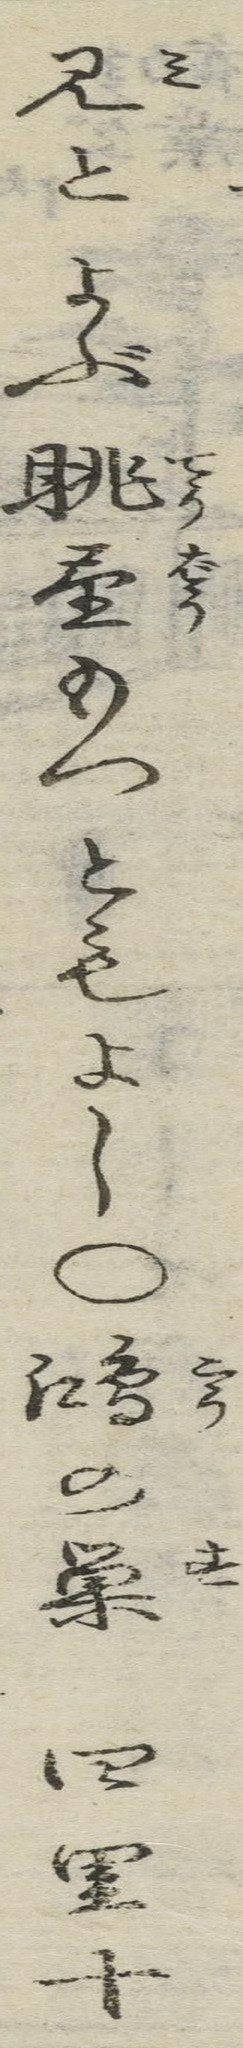見とよぶ眺望もつともよし○鴻の巣四里十
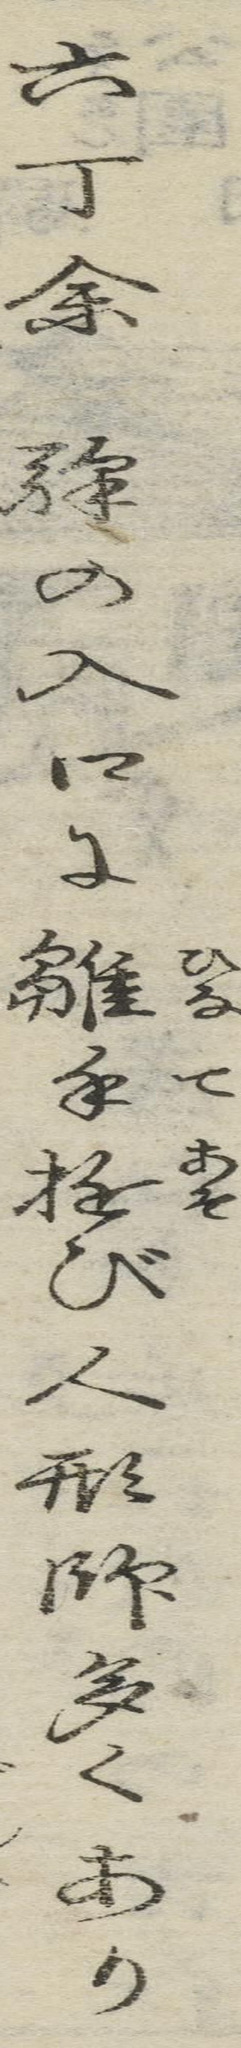六丁余駅の入口に雛手遊び人形師多くあり
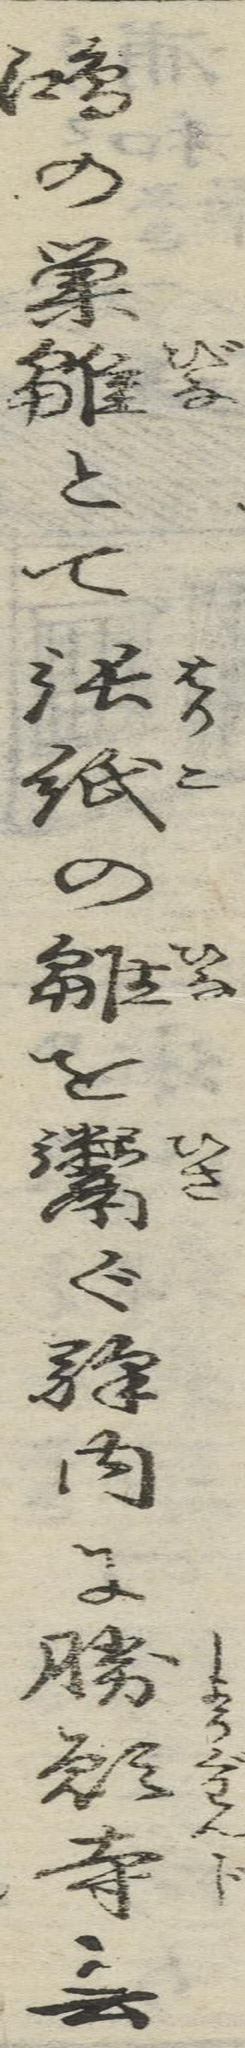鴻の巣雛とて張紙の雛を鬻ぐ駅内に勝願寺と云
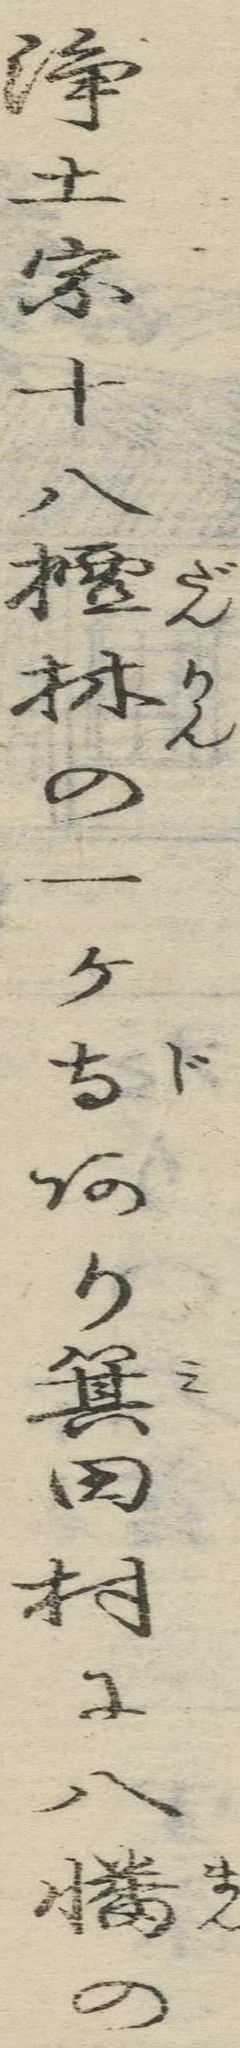浄土宗十八檀林の一ヶ寺あり箕田村に八幡の
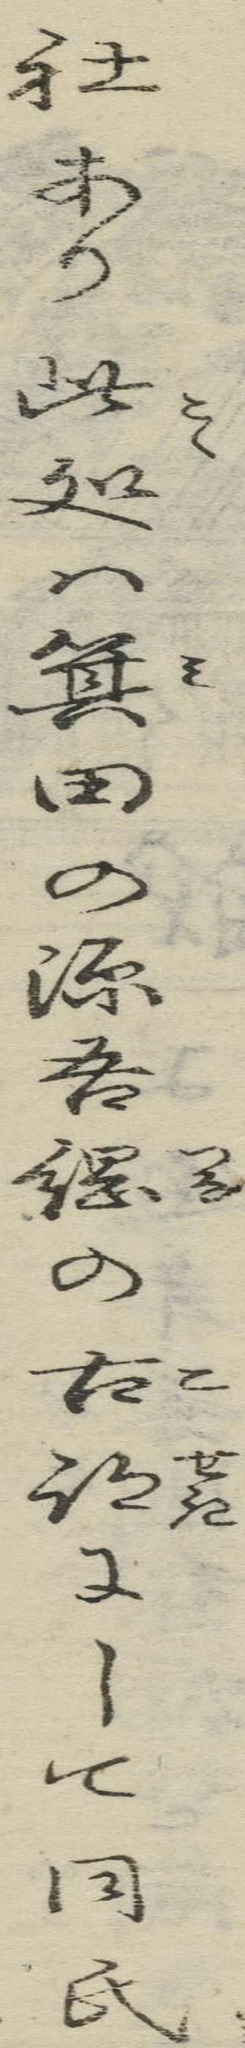社あり此処は箕田の源吾綱の古跡にして同氏
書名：上州伊香保鑛泉圖會　全
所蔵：東京大学地震研究所図書室 Earthquake Research Institute Library, The University of Tokyo, JAPAN
